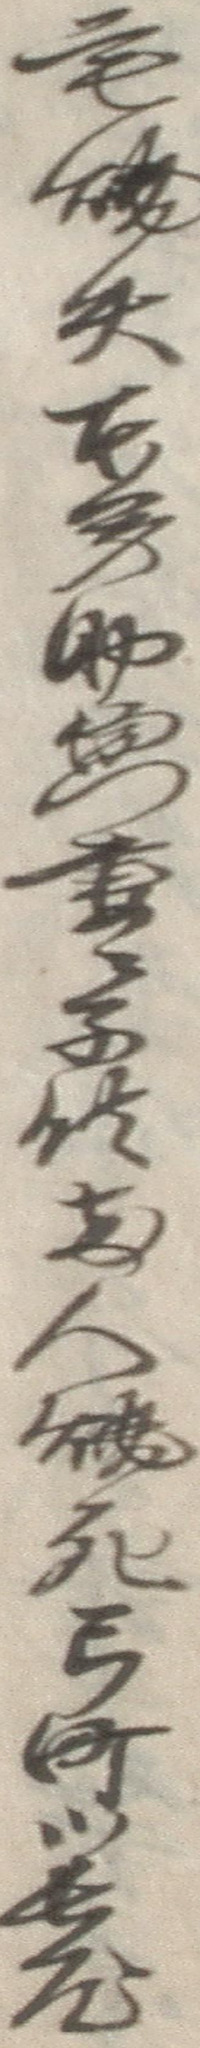宅焼失本多助左衛門妻二子供両人焼死弓町御長屋
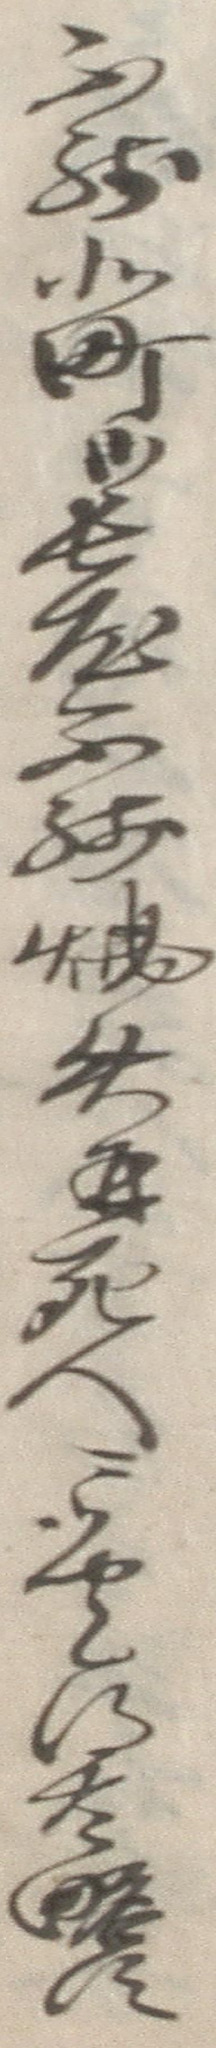不残北町御長屋不残焼失并死人二御座候得共略す
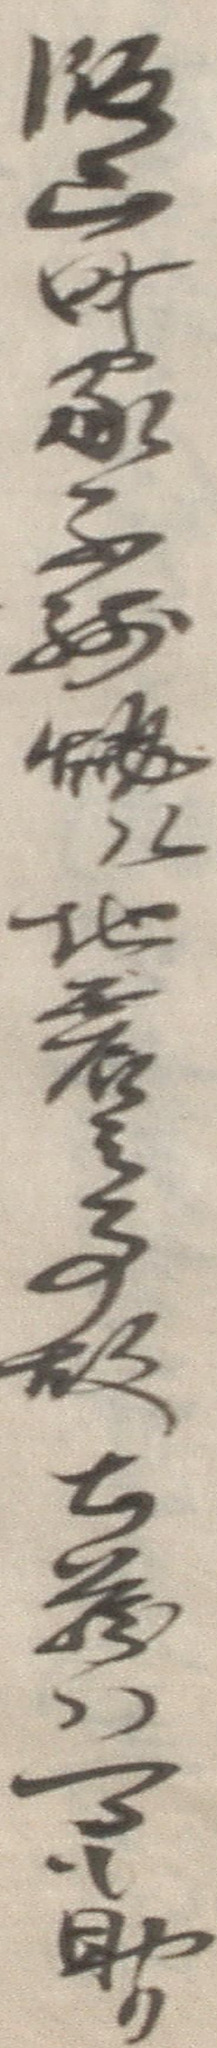飯山町家不残焼ㇽ地震之事故土蔵ハ一ッも助り
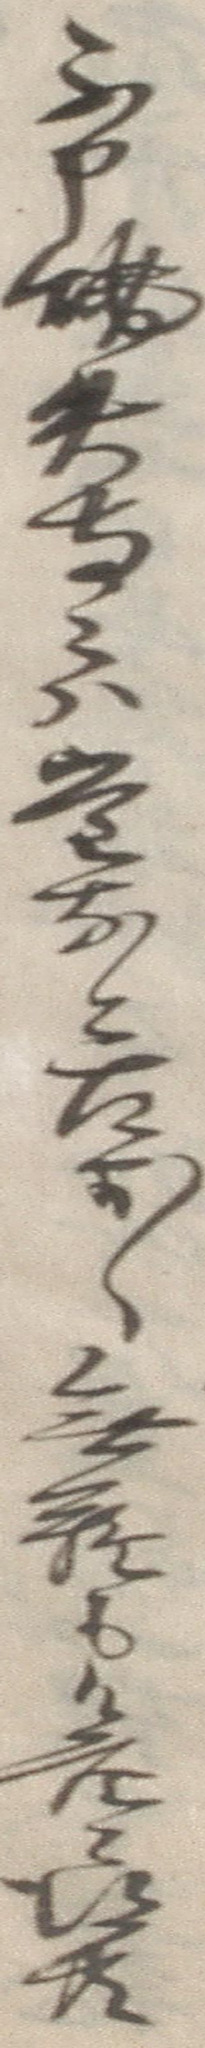不申焼失寺二ハ堂なとたま〳〵無難も御座候得共
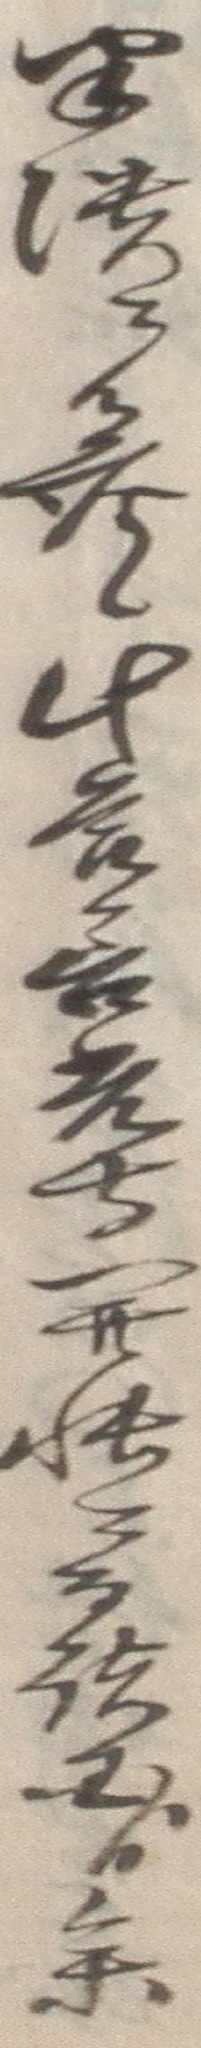半潰二御座候此節善光寺開帳二而諸国ゟ参
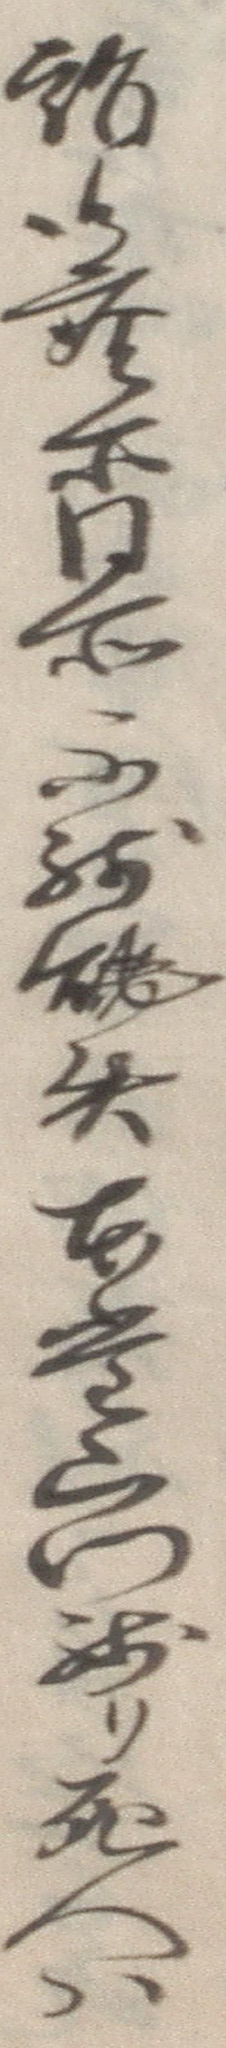詣御座候所同所不残焼失本堂山門残り死人ハ
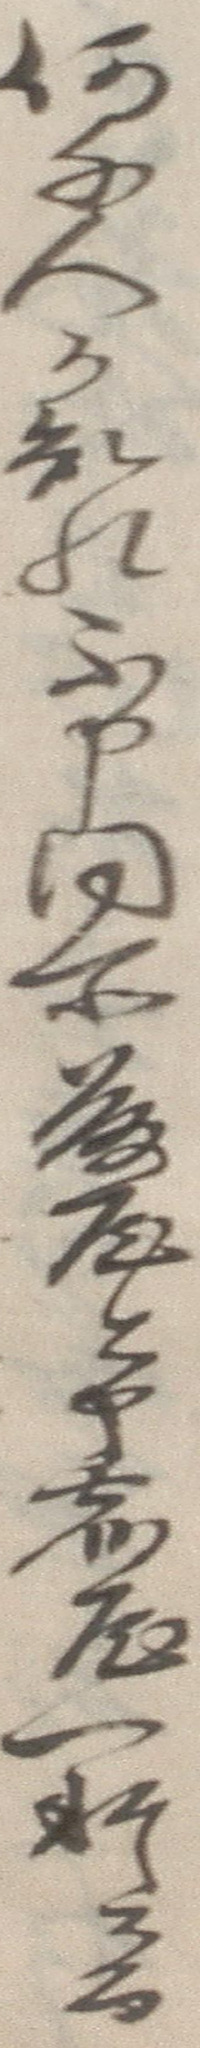何千人か知れ不申同所藤屋と申宿屋一軒二而
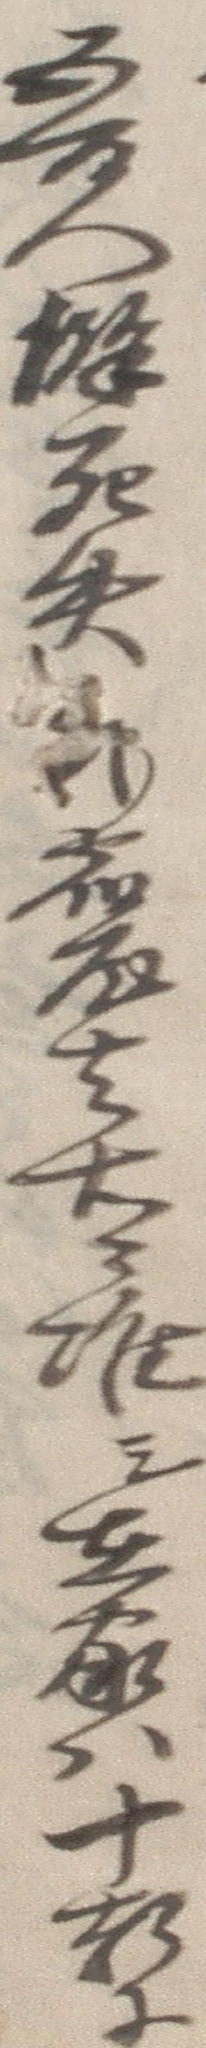五百人餘死失宿屋は右二准ㇱ在家ハ十軒に
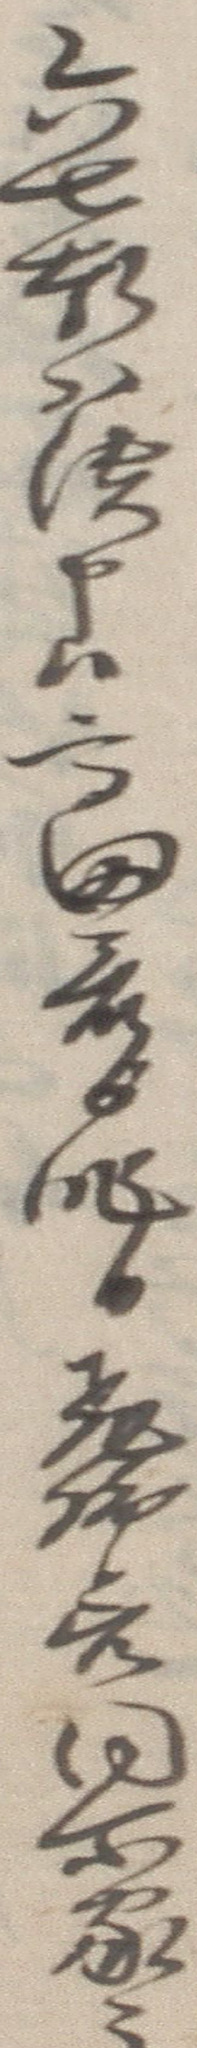六七軒ハ潰申候高田表ゟ昨日飛脚共同所家々
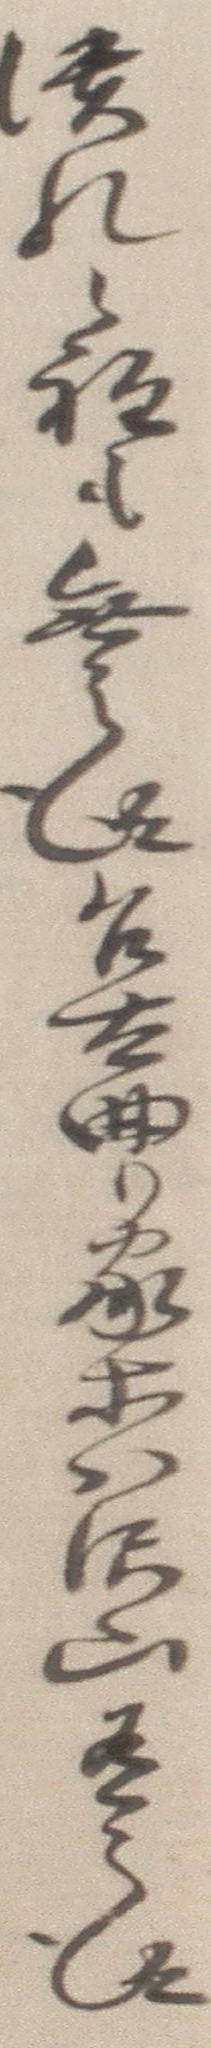潰候程も無之趣乍去曲り家等ハ沢山有之趣
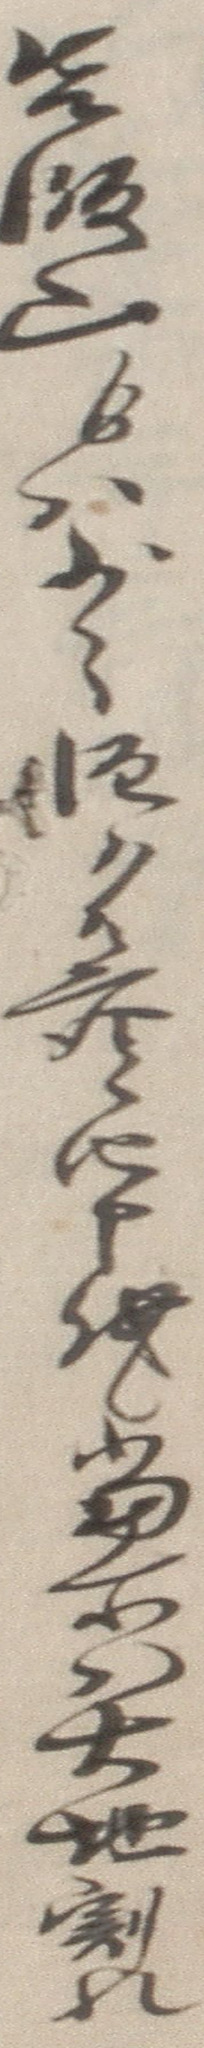先飯山ゟハ少々軽ク御座候由申儀候当所ハ大地割れ
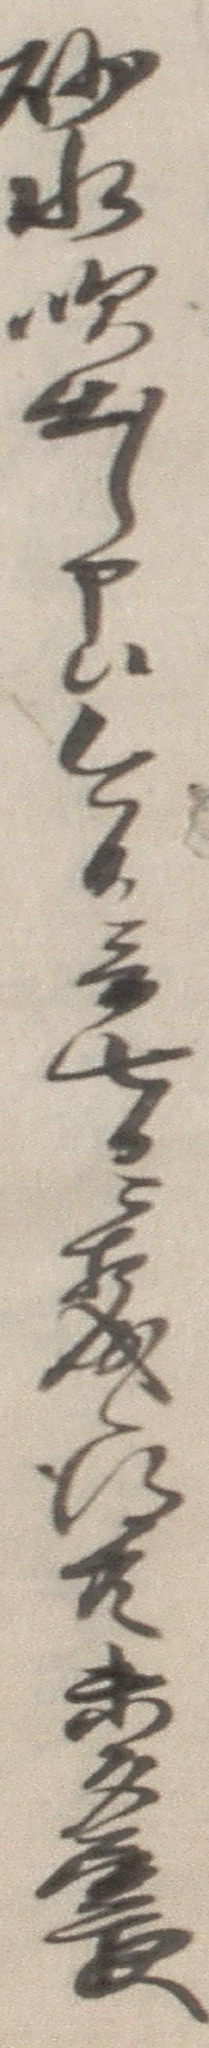砂水吹出し申候今日二而七日二相成候得共未タ昼夜
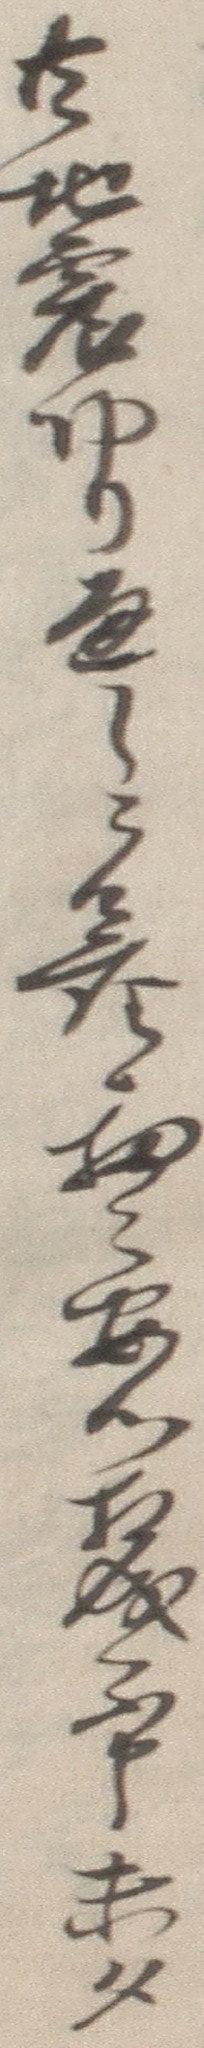共地震ゆり通し二御座候扨々安心相成不申未タ
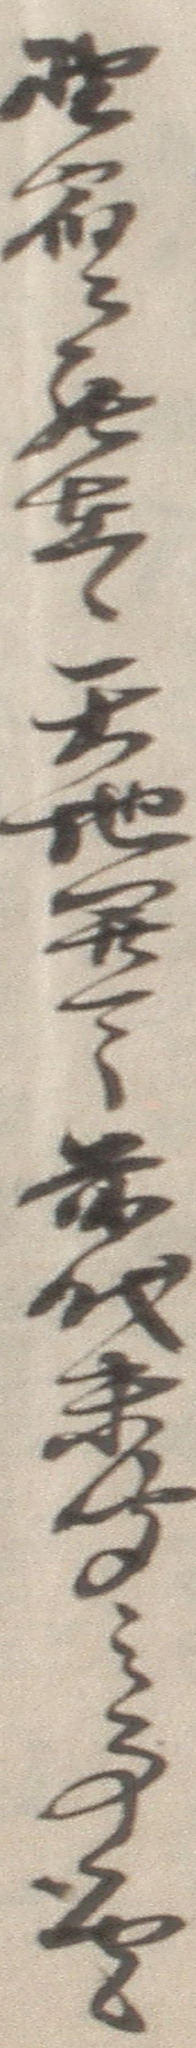野宿二罷在候天地開て前代未聞之事御座候
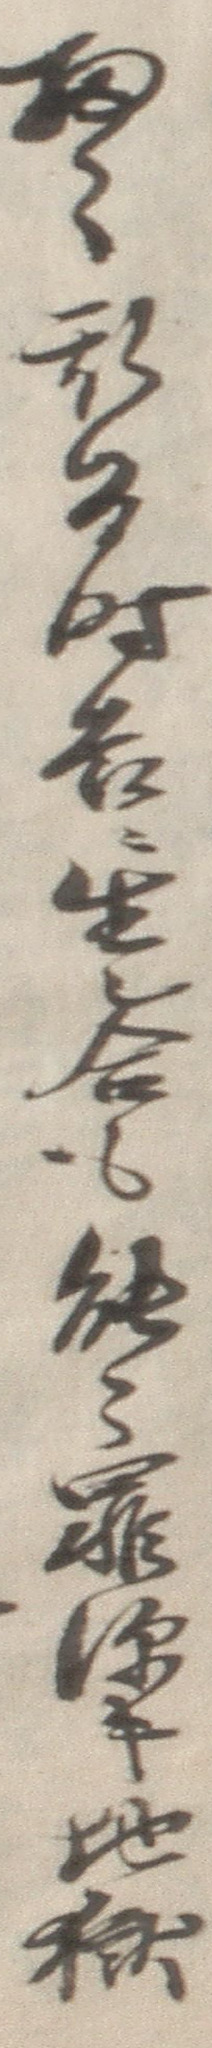扨々斯如時節二生レ合も能々罪深キ地獄
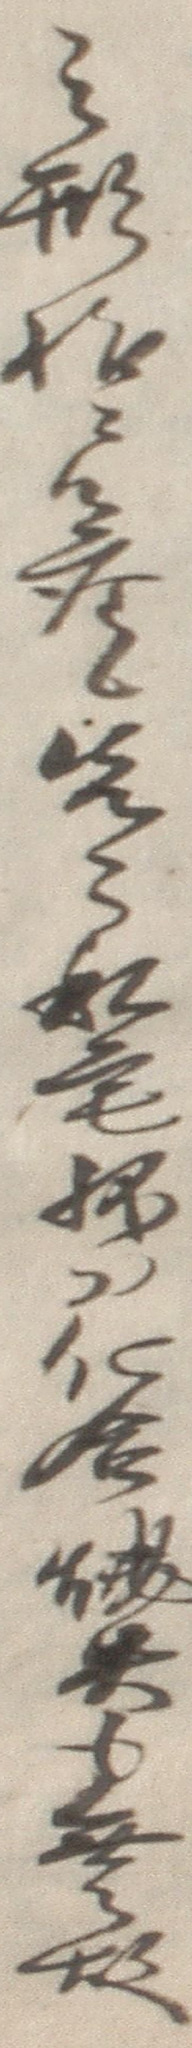之形様二御座候先々私宅儀ハ仕合焼失も無之故
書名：信州地震一件
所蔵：東京大学地震研究所図書室 Earthquake Research Institute Library, The University of Tokyo, JAPAN
